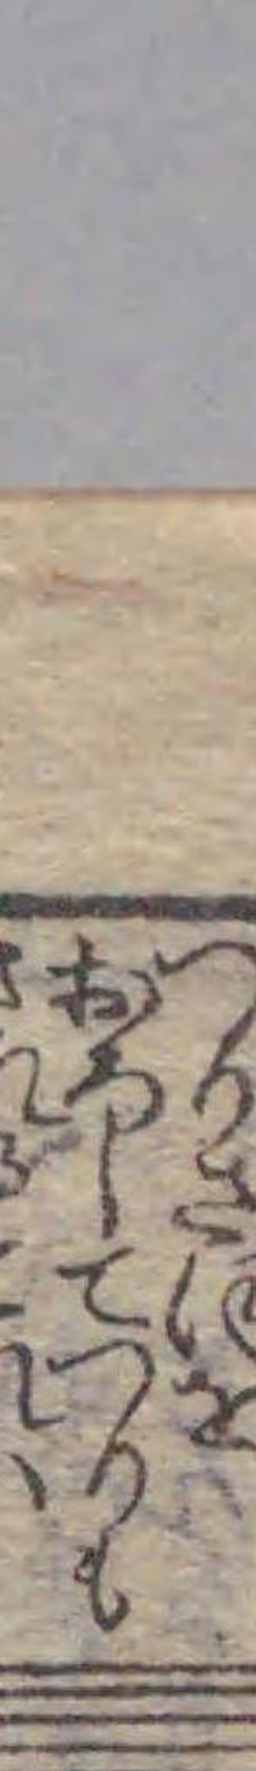おろしてつりも
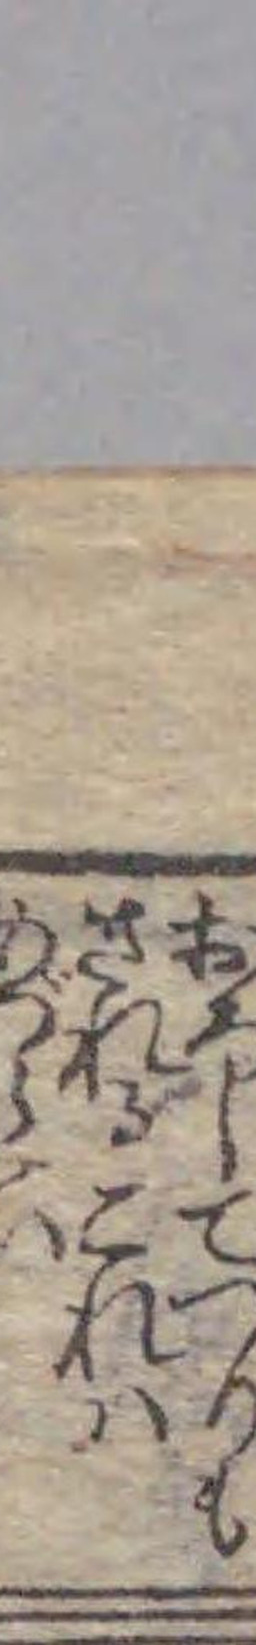されるこれは
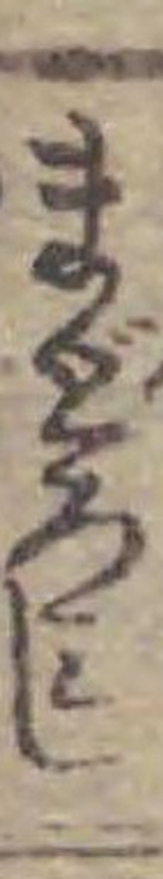まどろみし
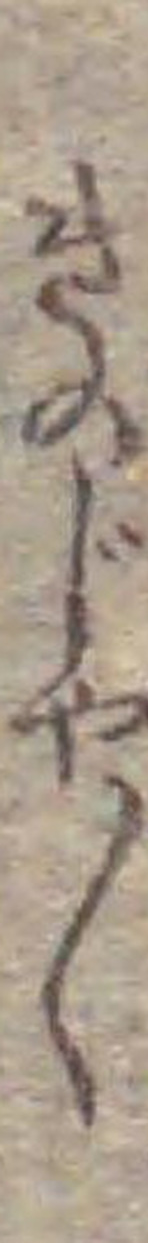きのじや〳〵
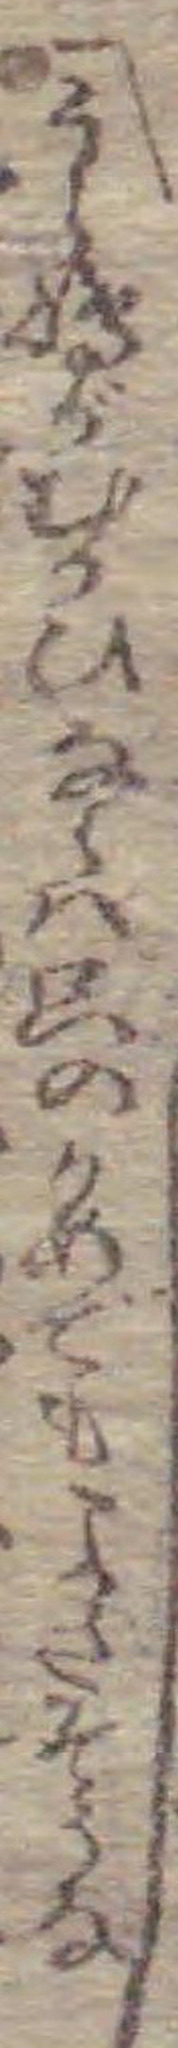〽うら島がむかひならは只のかめでもよさそうな
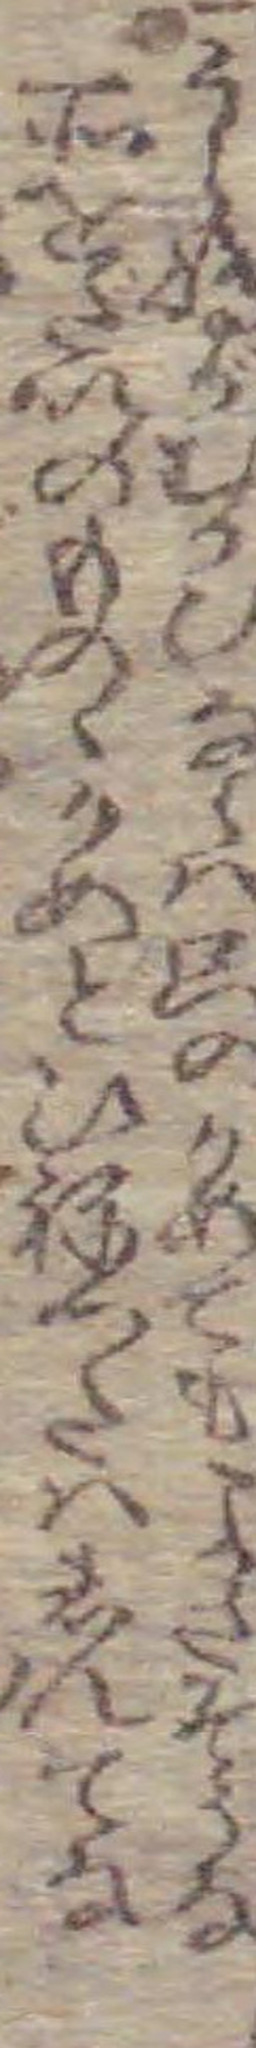所をだいのものゝかめとひねつたはしんてな
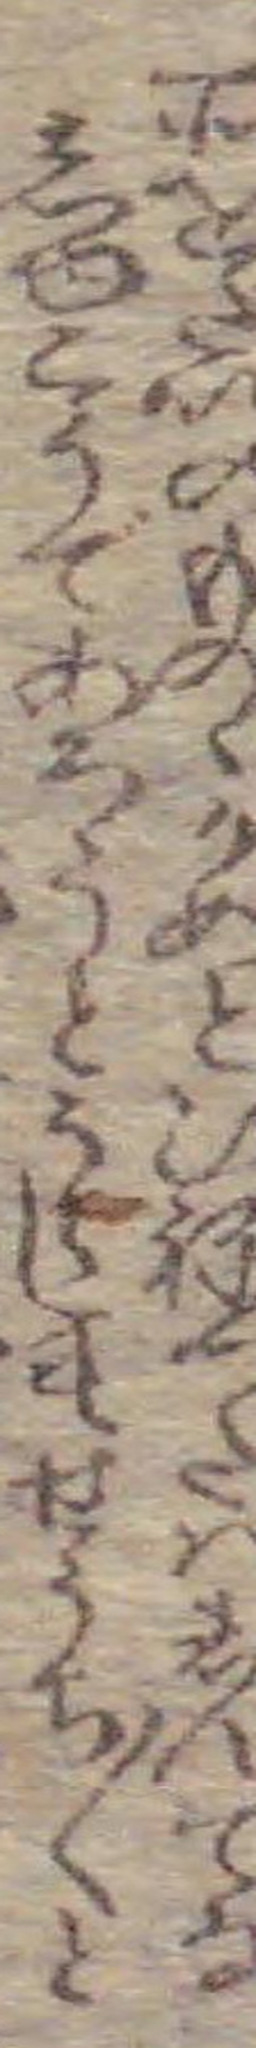しゆこうであろうとうらしませうち〳〵と
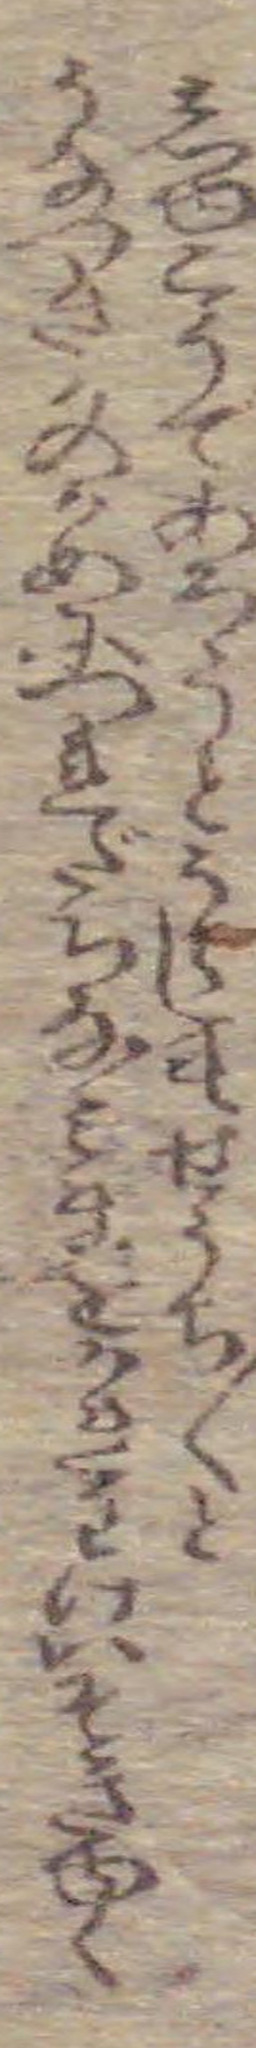うなつきかのかめにつれだちなみまをかきわけいそきゆく

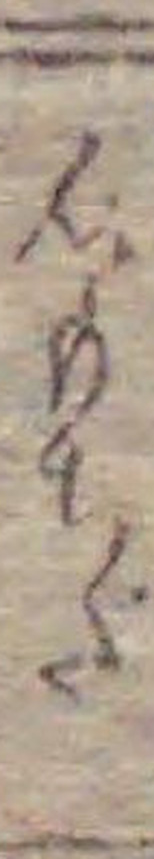心もちだ
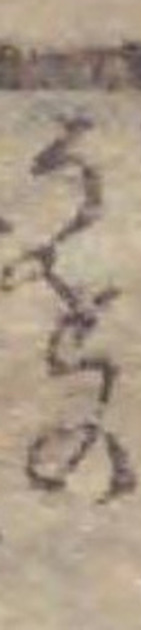うをの
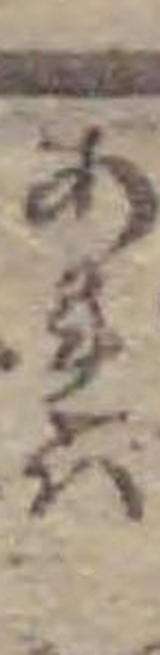あれば
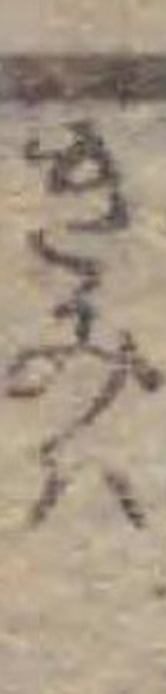きみは
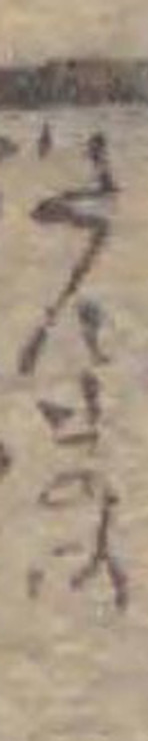さんまの
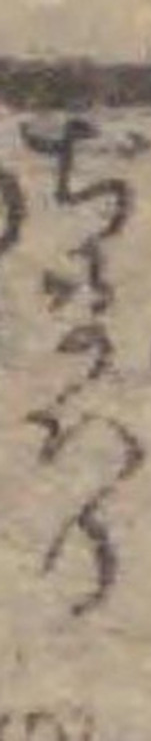ぢまはり
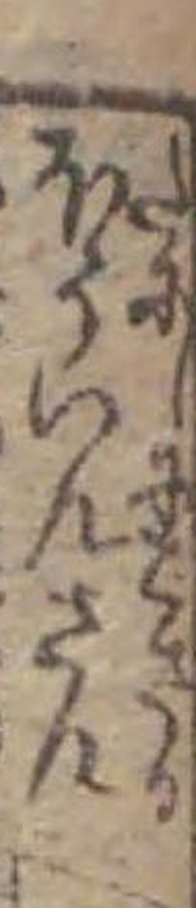ほういんさん
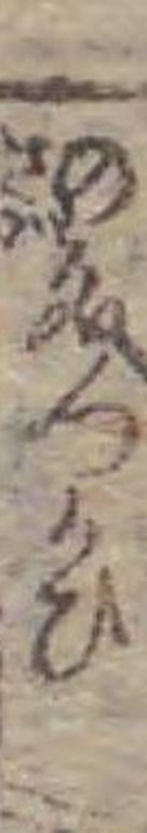の取つかひ
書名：竜宮苦界玉手箱 : 3巻
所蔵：国立国会図書館 National Diet Library, JAPAN
